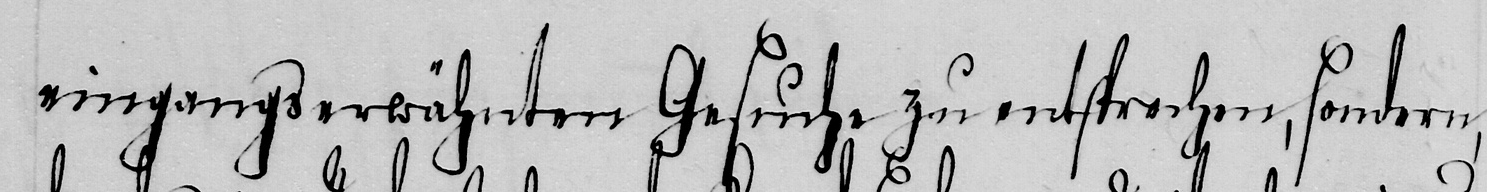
eingangs erwähnten Gesuche zu entsprechen, sondern,
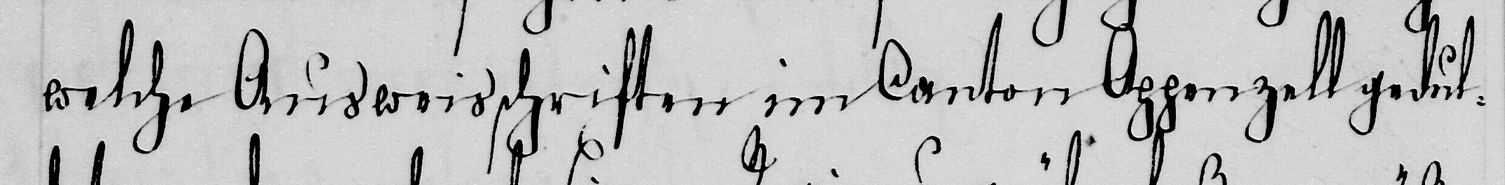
welche Ausweisschriften im Canton Appenzell gedul¬
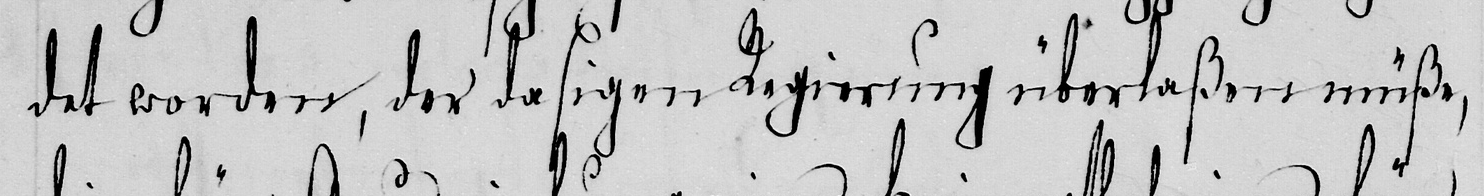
det worden, der dasigen Regierung überlaßen müße,
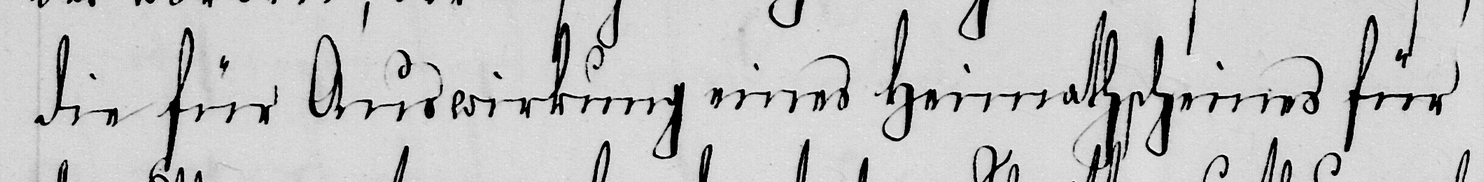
die für Auswirkung eines Heimathscheines für
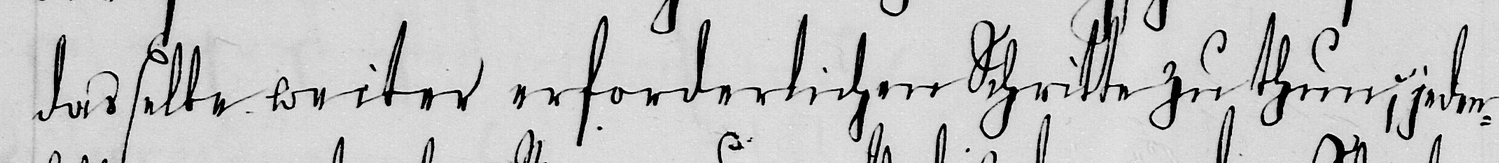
dasselbe weiter erforderlichen Schritte zu thun; jeden¬
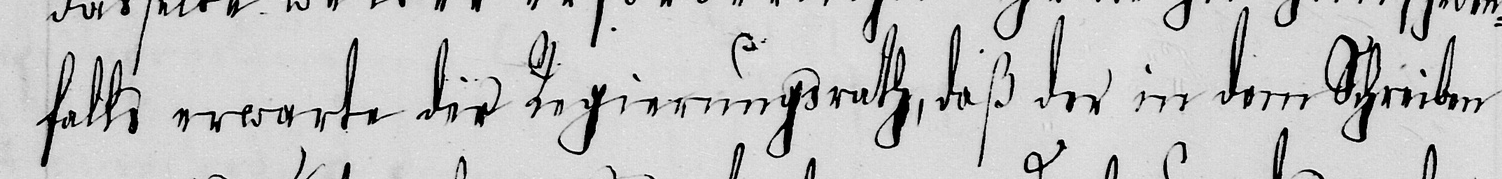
falls erwarte der Regierungsrath, daß der in dem Schreiben
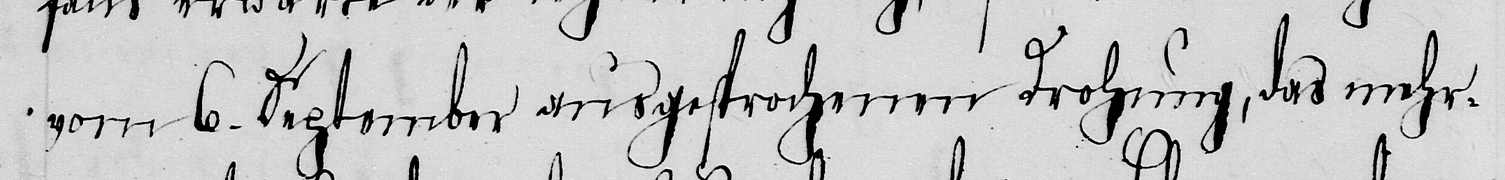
vom 6. September ausgesprochenen Drohung, das mehr¬
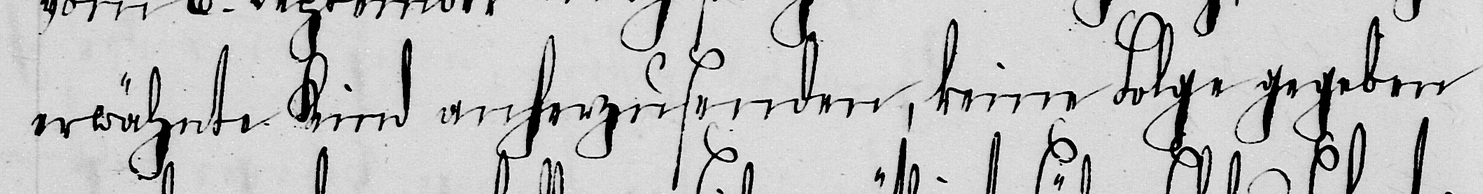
erwähnte Kind anherzusenden, keine Folge gegeben
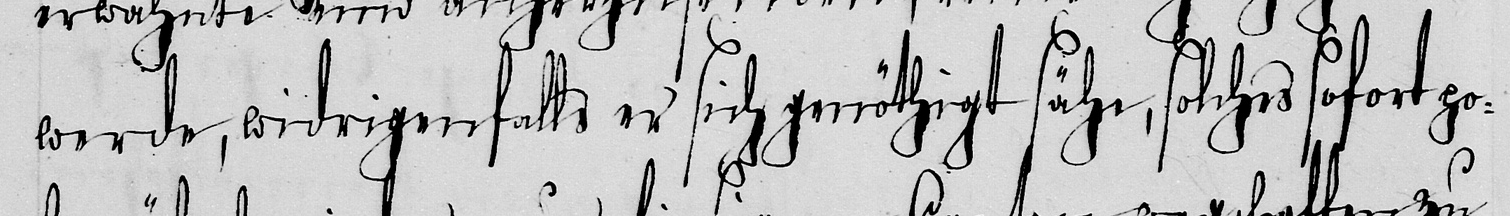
werde, widrigenfalls er sich genöthigt sähe, solches
